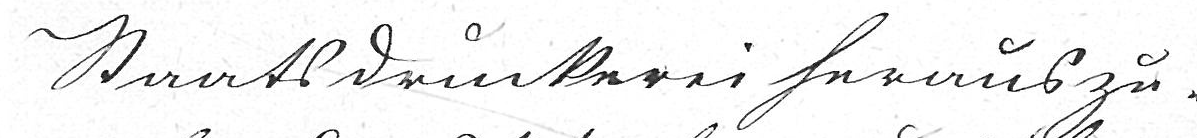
Staatsdruckerei herauszu-
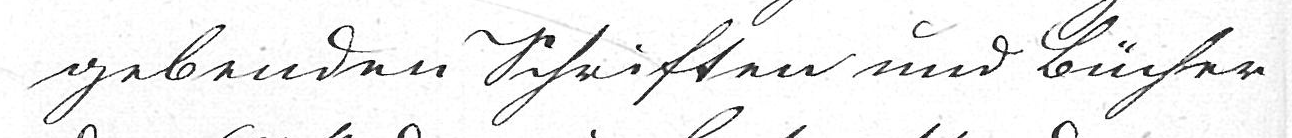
gebenden Schriften und Bücher
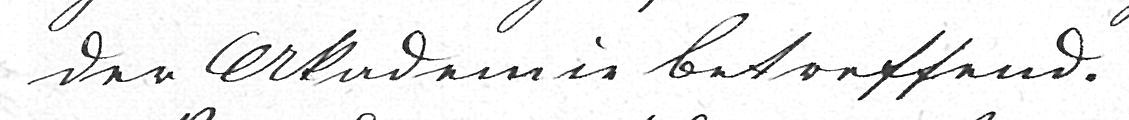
der Akademie betreffend.
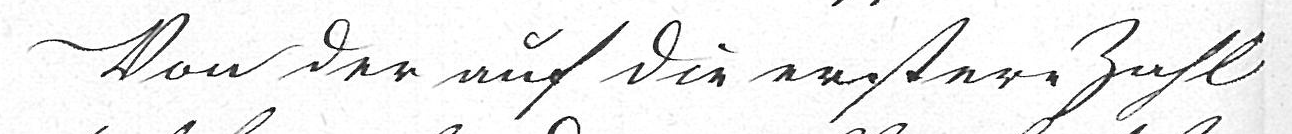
Von der auf die erstere Zahl
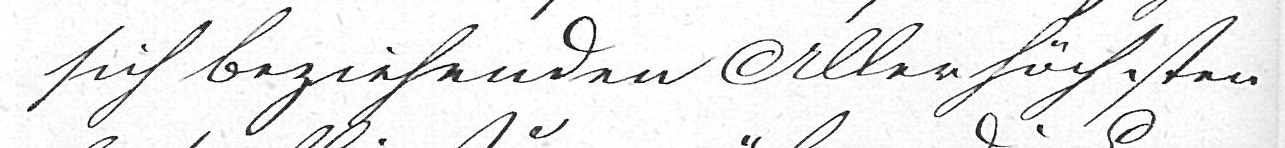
sich beziehenden Allerhöchsten
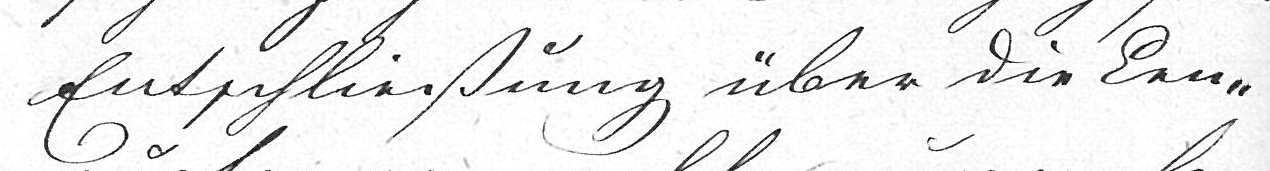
Entschließung über die Cen-
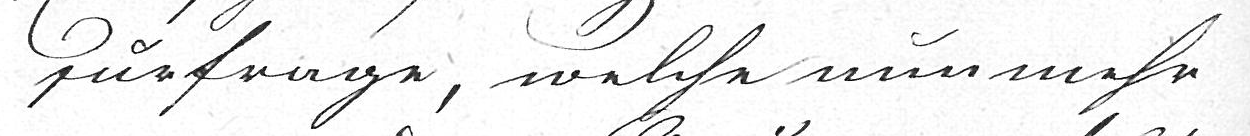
surfrage, welche nun mehr
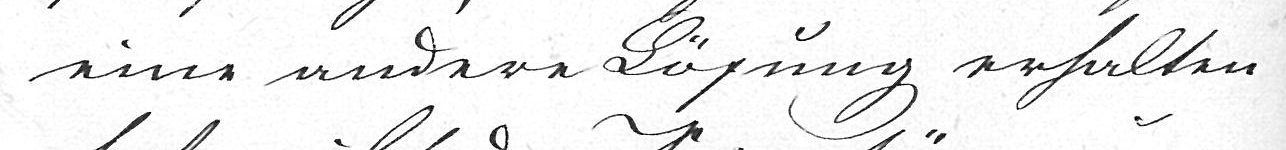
eine andere Lösung erhalten
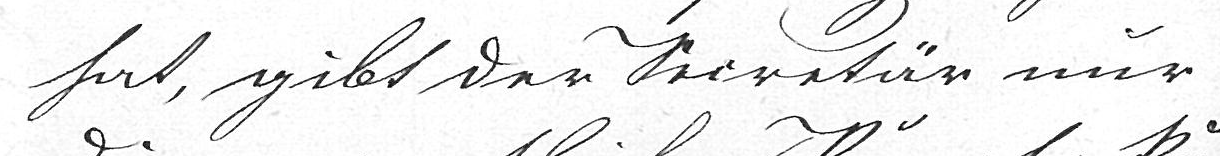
hat, gibt der Secretär nur
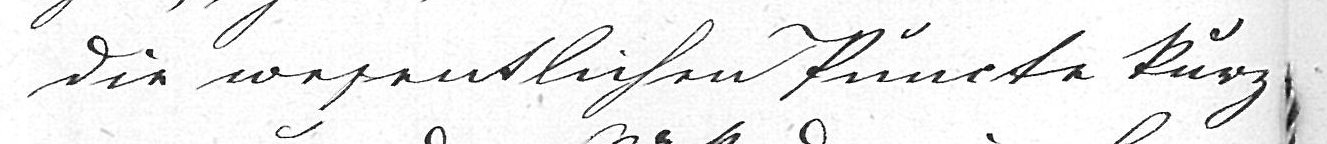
die wesentlichen Puncte kurz
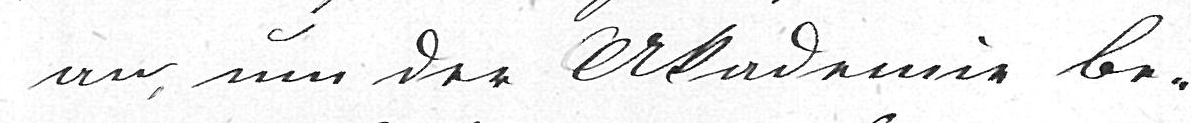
an, um der Akademie be-
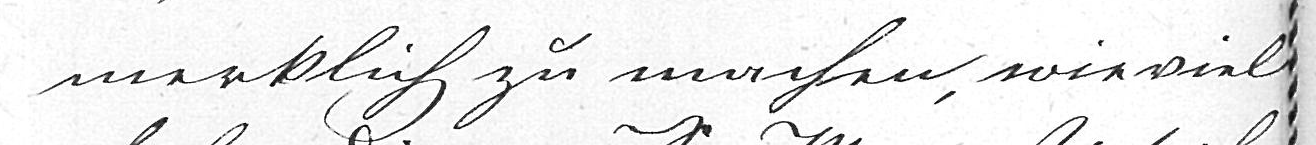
merklich zu machen, wieviel
